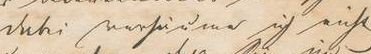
Dabei versäume ich nicht,
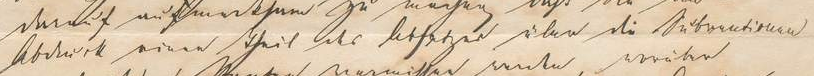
Abdruck einen Theil des Absatzes über die Subventionen
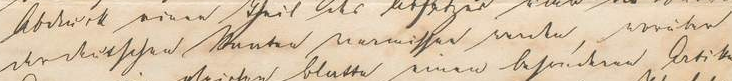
der deutschen Staaten vermissen werden, worüber
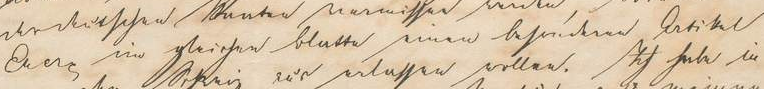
Euer pp im gleichen Blatte einen besonderen Artikel
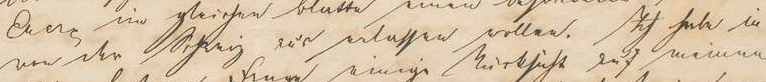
von der Schweiz aus erlassen wollen. Ich habe in
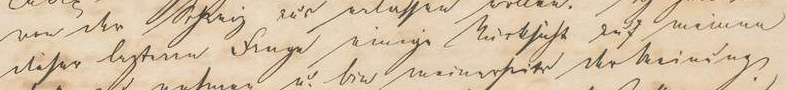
dieser letzteren Frage einge Rücksicht auf meinen
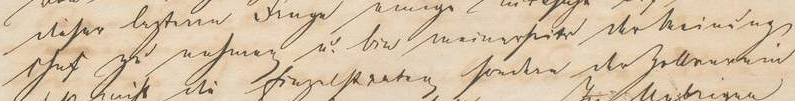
Chef zu nehmen, u. bin meinerseits der Meinung,
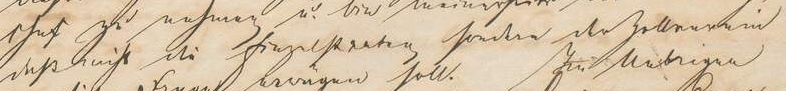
daß nicht die Einzelstaaten, sondern der Zollverein
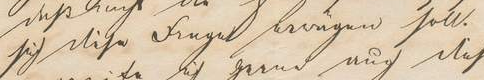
sich diese Frage erwägen soll.
